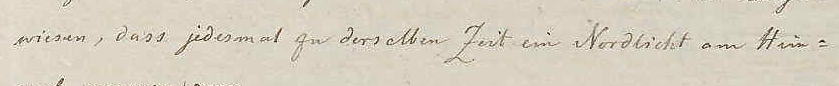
wiesen, dass jedesmal zu derselben Zeit ein Nordlicht am Him-
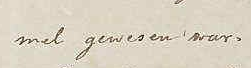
mel gewesen war.
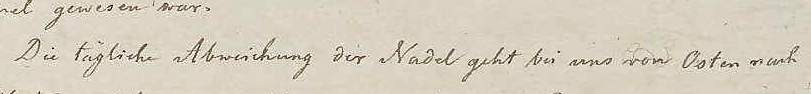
Die tägliche Abweichung der Nadel geht bei uns von Osten nach
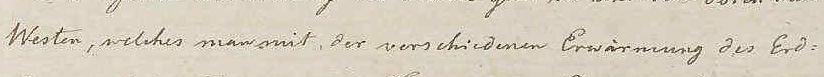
Westen, welches man mit der verschiedenen Erwärmung des Erd-
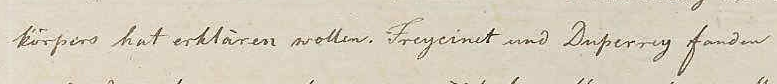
körpers hat erklären wollen. Freycinet und Duperrey fanden
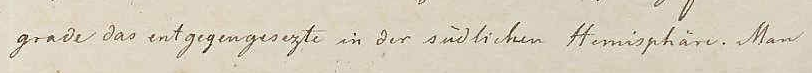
grade das entgegengesezte in der südlichen Hemisphäre. Man
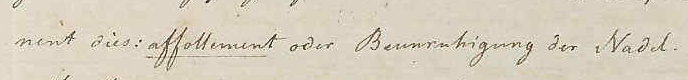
nent dies: affollement oder Beunruhigung der Nadel.
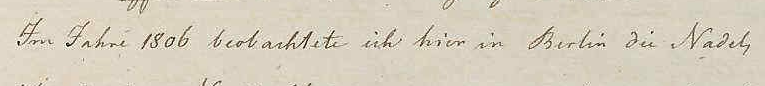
Im Jahre 1806 beobachtete ich hier in Berlin die Nadel,
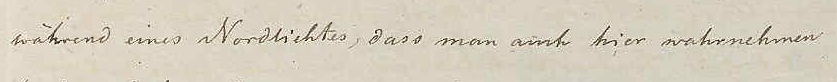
während eines Nordlichtes, man auch hier wahrnehmen
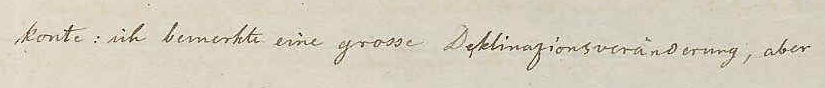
konte: ich bemerkte eine grosse Deklinazionsveränderung, aber
